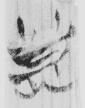莫
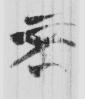不
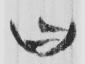曰
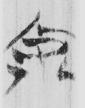余
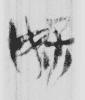{女呆}
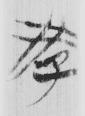𡥈
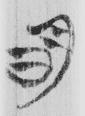明
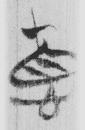惪
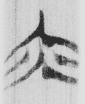亦
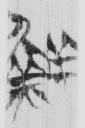鮮
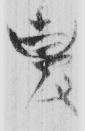尅
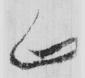㠯（以）
